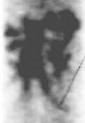無
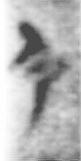弓
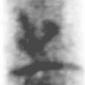之
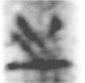之
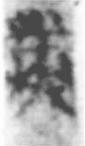無
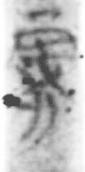○（蒙）
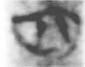四
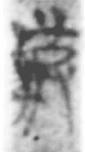鞁
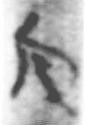六
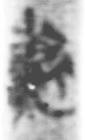○（轡）
